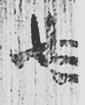廿=
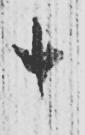十
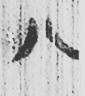八
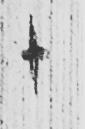十
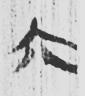六
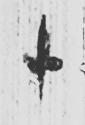十
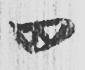四
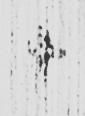十
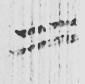二
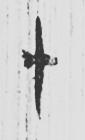十
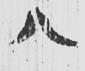八
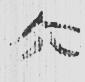六
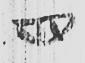四
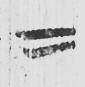二
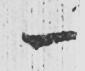一
